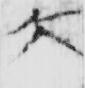大
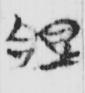脰（厨）
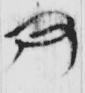尹
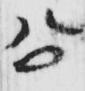公
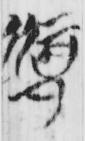○（弼）
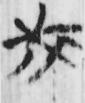必
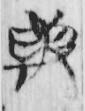與
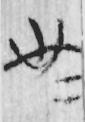三十
